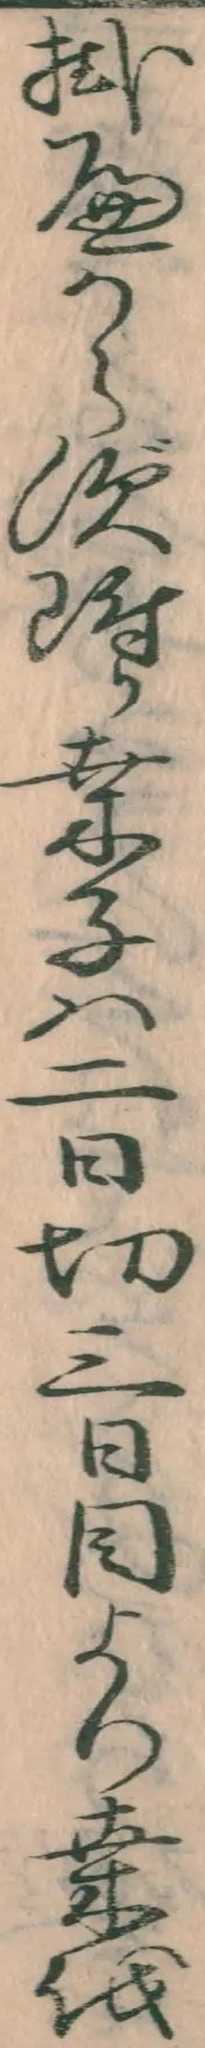掛へからず附り桑子は二日切三日目より桑を
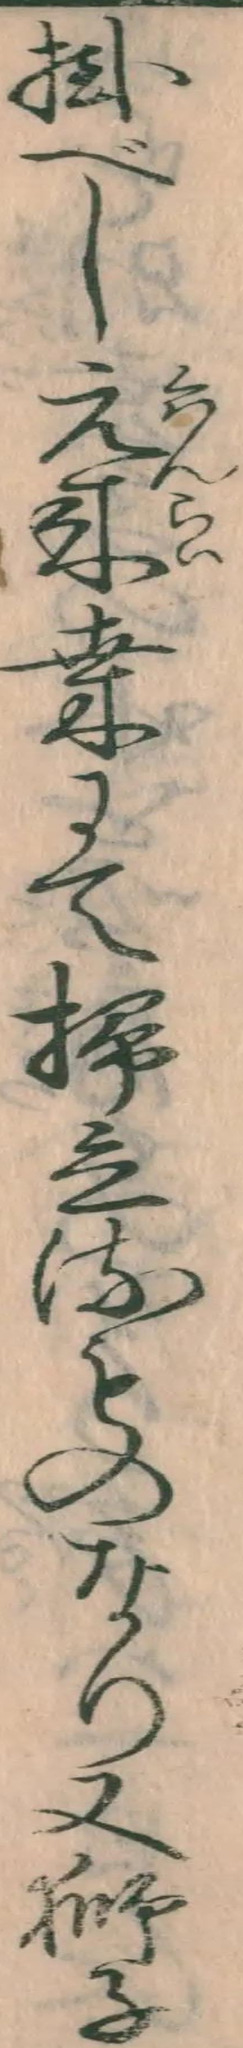掛べし元来桑にて掃立るものなり又獅子
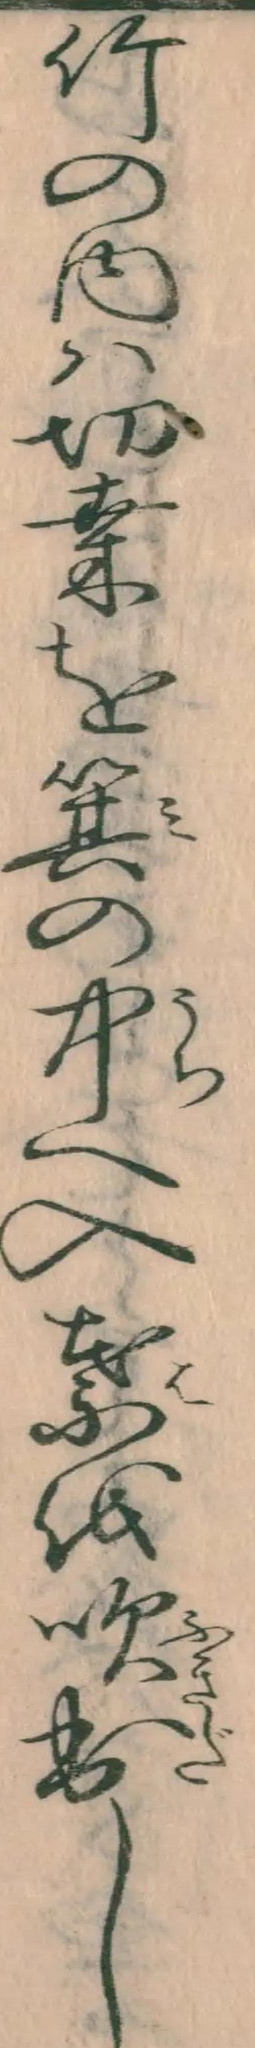竹の内は切桑を箕の中へ入葉を吹出し
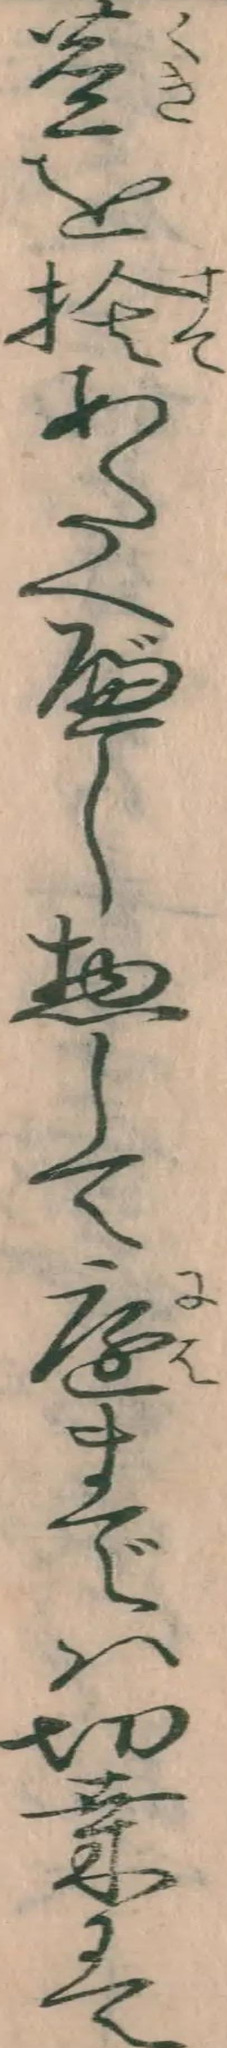茎を捨あたへべし惣して庭までは切桑にて
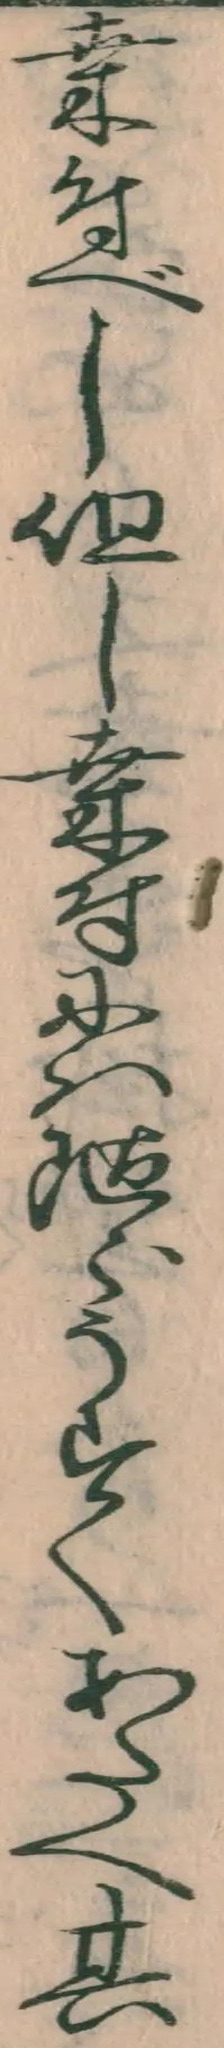桑付べし但し桑付には随分うすくあたへ其
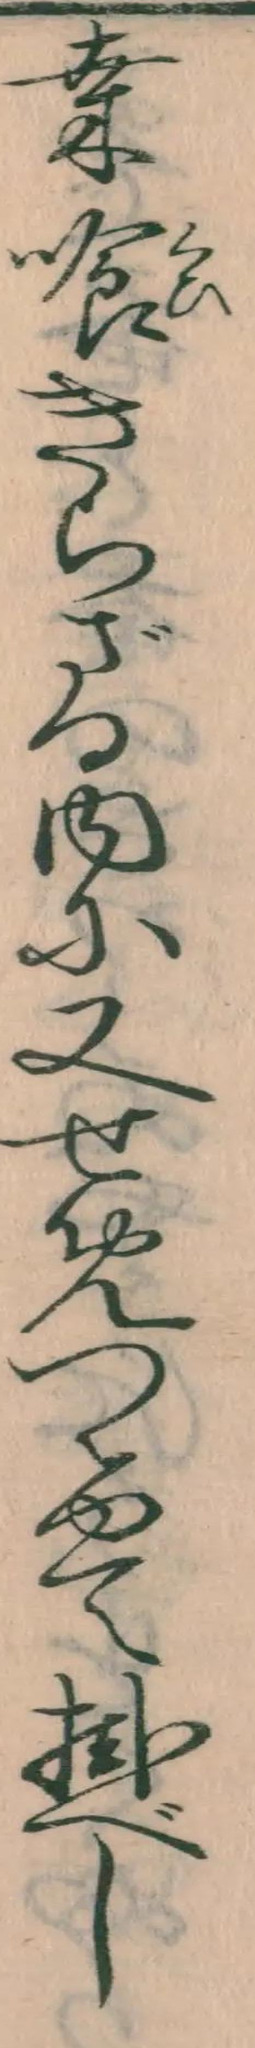桑喰きらざる内に又せめつけて掛べし
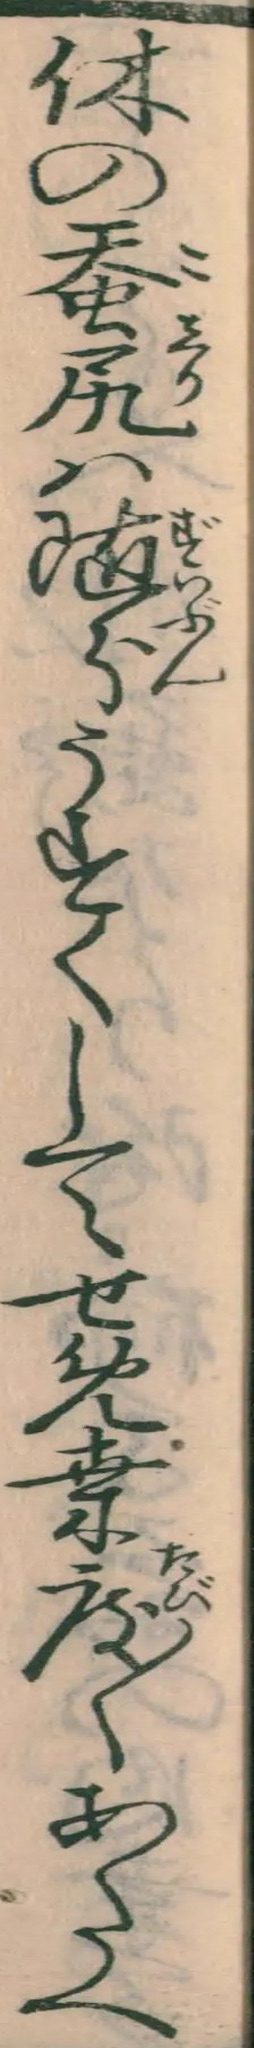休の蚕尻は随分うすくしてせめ桑度〳〵あたへ
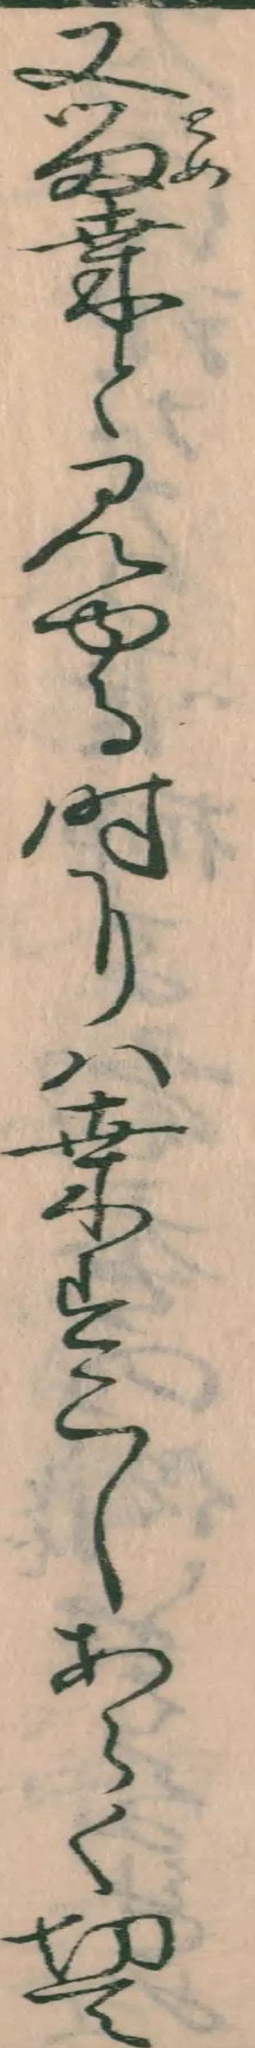又留桑と見ゆる時には桑すこしあらく切て
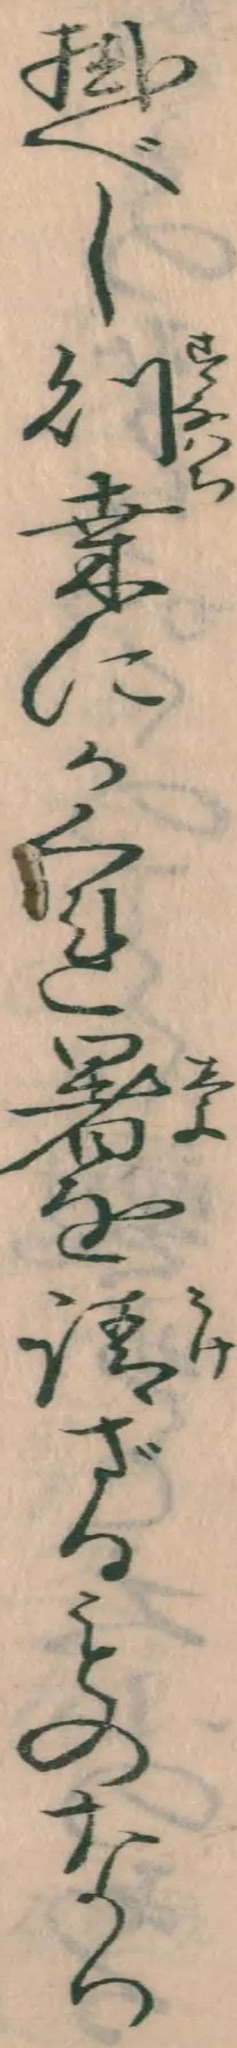掛べし則桑にかくれ暑を請ざるものなり
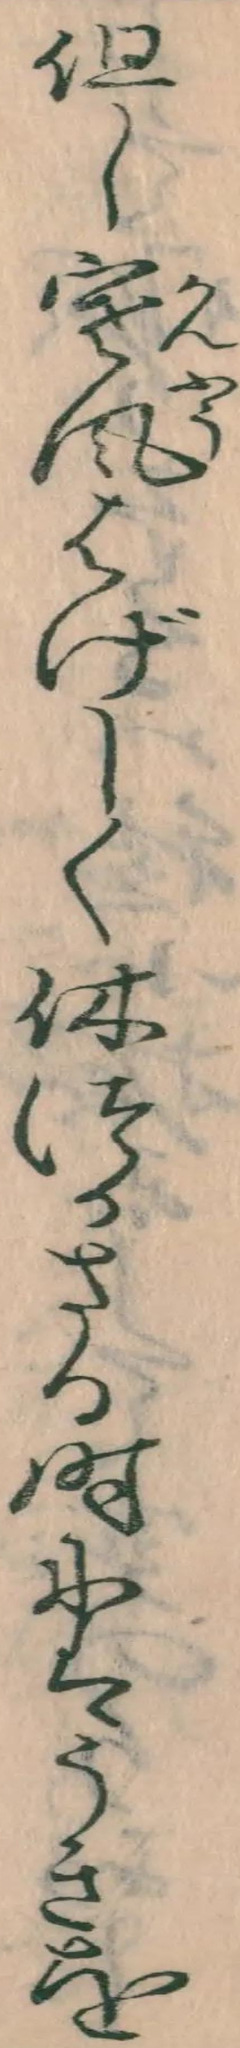但し寒風はげしく休つかさる時にはうきを
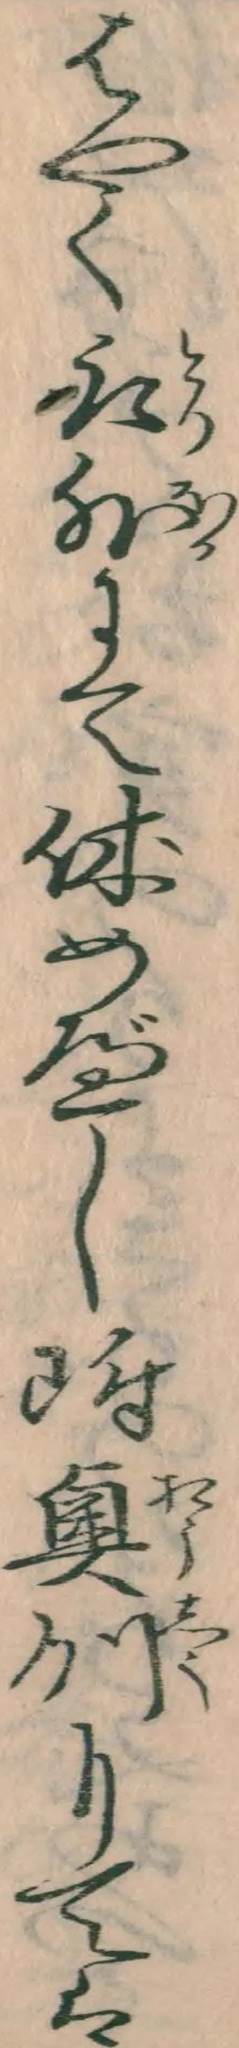はやく取外にて休めべし附奥州にては
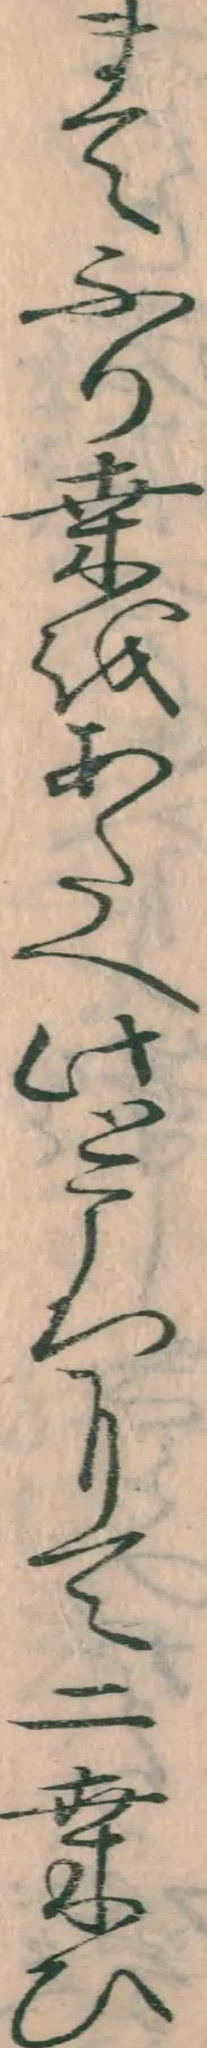まてふり桑をあたへ此ところにて二桑ひ
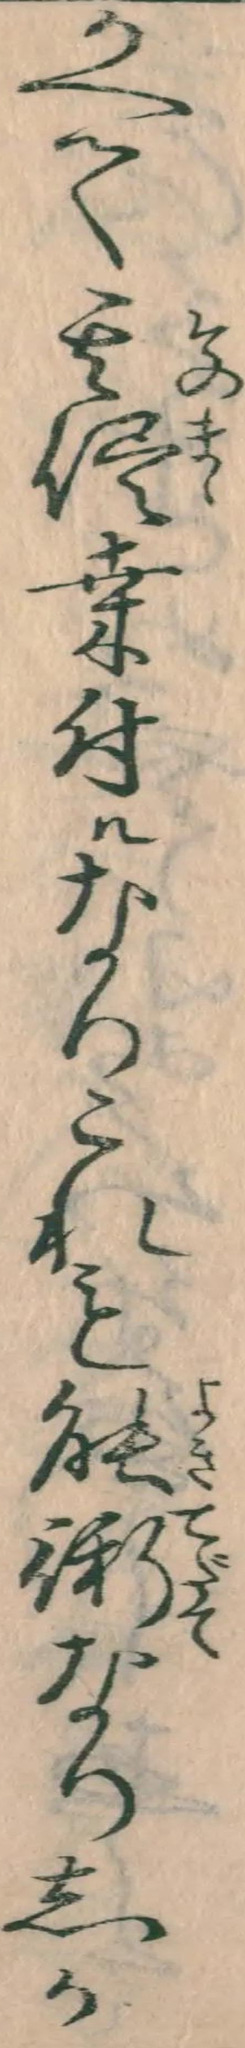かへて其侭桑付るなりこれも能術なりしか
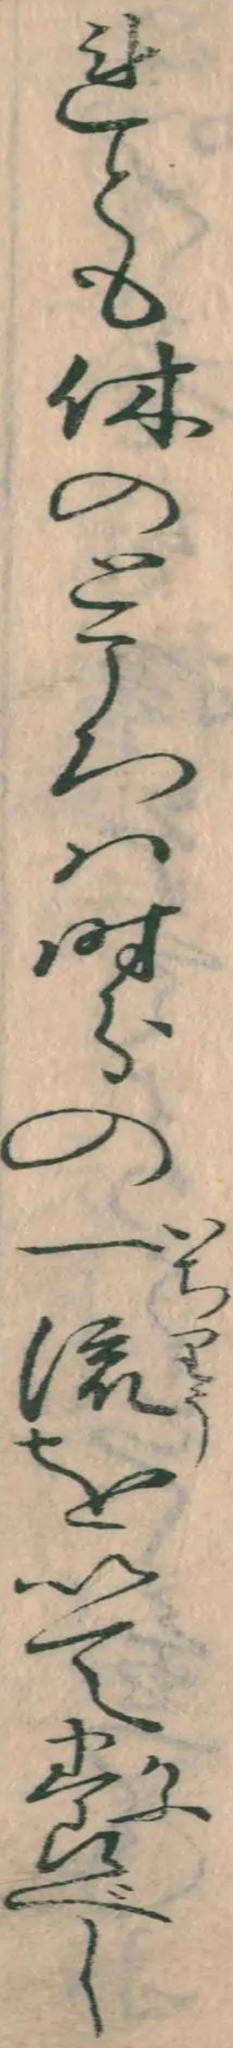れとも休のところは時分の一流を以て養べし

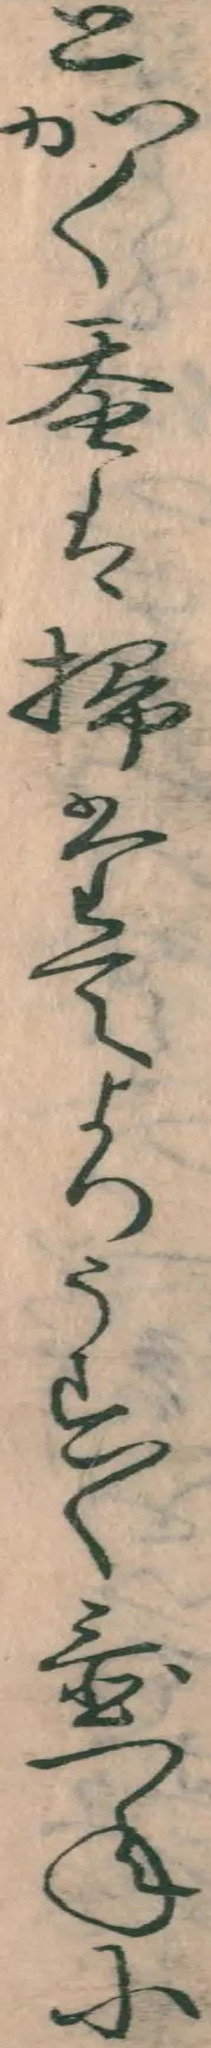とかく蚕は掃たてよりうすく置つねに
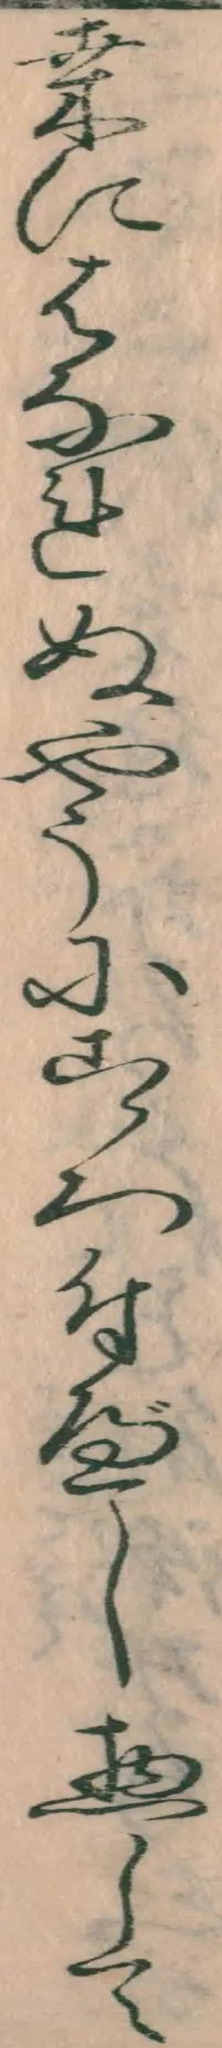桑にはなれぬやうにこゝろ付べし惣して
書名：新撰養蚕秘書
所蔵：国立国会図書館 National Diet Library, JAPAN
